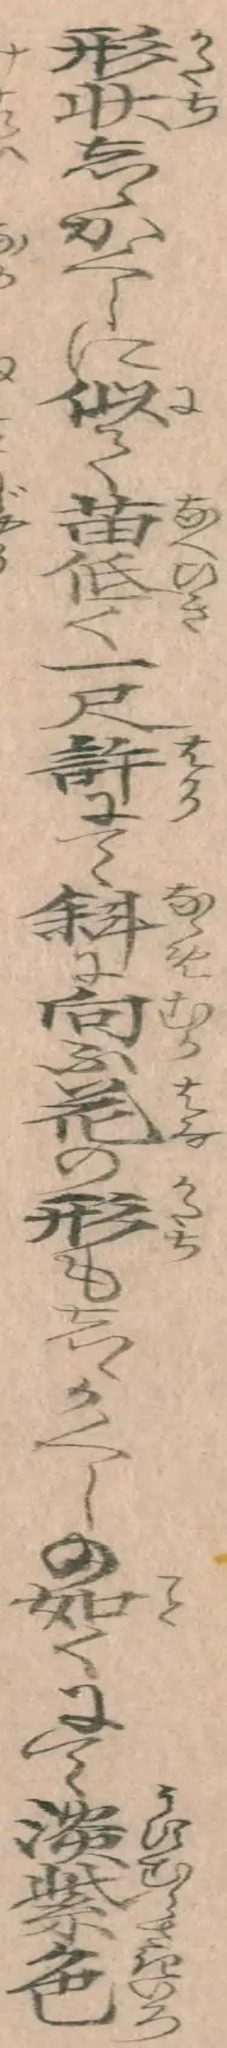形状しゝかくしに似て苗低く一尺許にて斜に向ふ花の形もしゝかくしの如くにて淡紫色
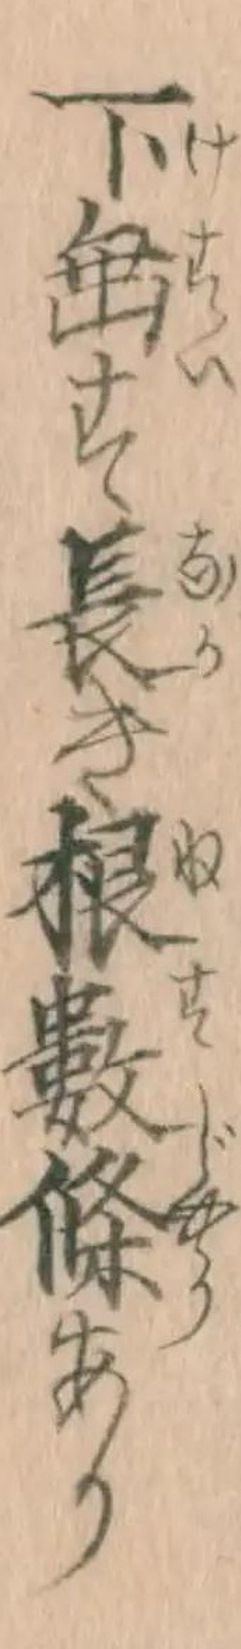下垂す長き根数条あり
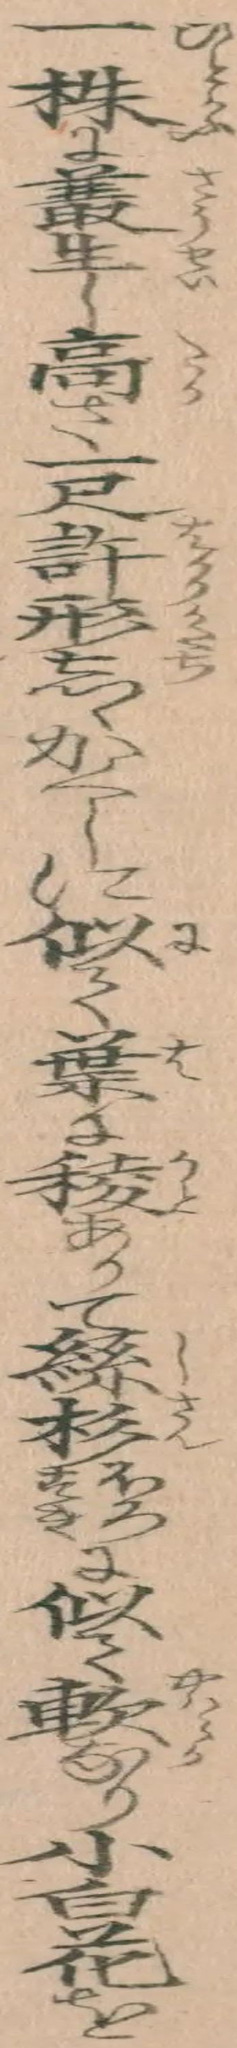一株に叢生し高さ一尺許形しゝかくしに似て葉に稜ありて糸杉ほろすきに似て軟なり小白花を
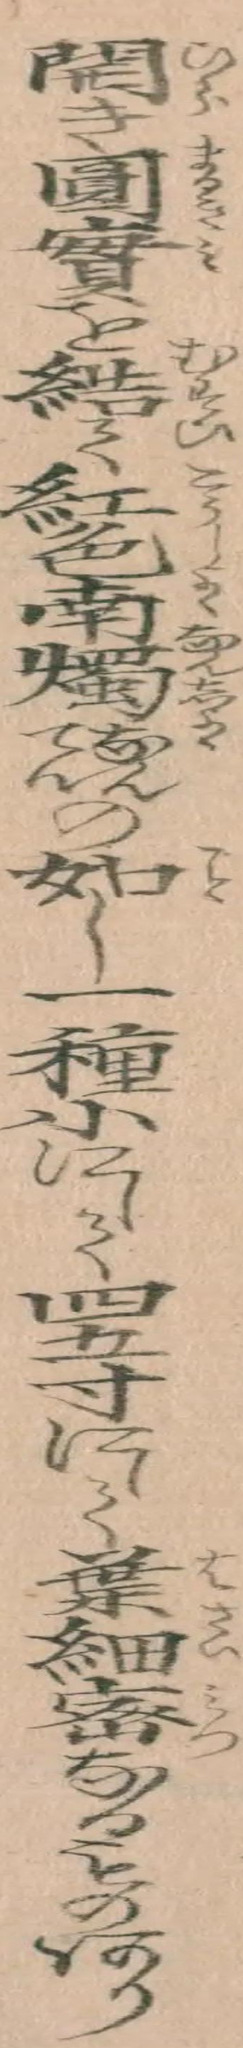開き円実を結て紅色南燭なんてんの如し一種小にして四五寸にして葉細密なるものあり
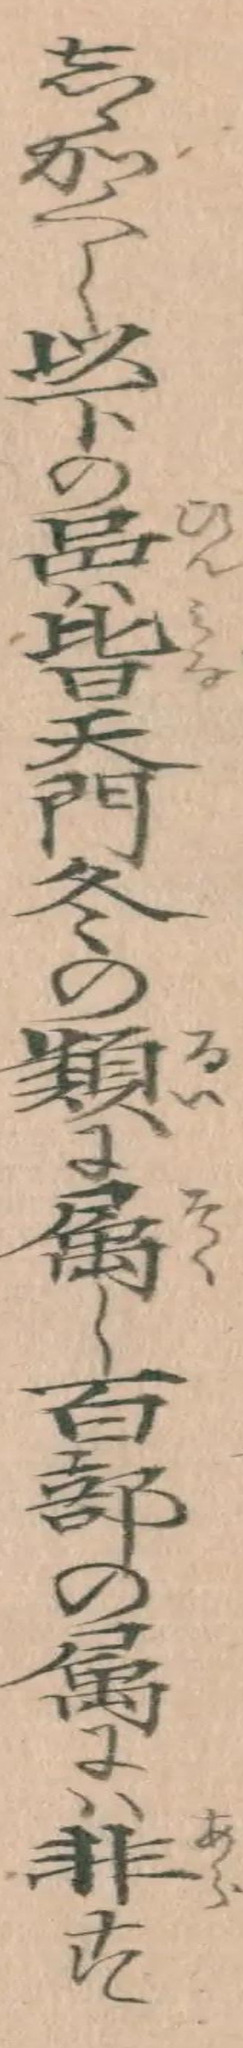しゝかくし以下の品は皆天門冬の類に属し百部の属には非す
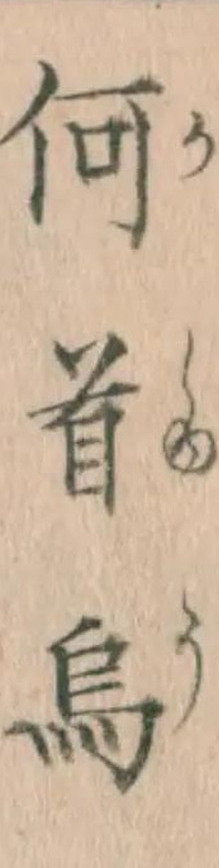何首烏
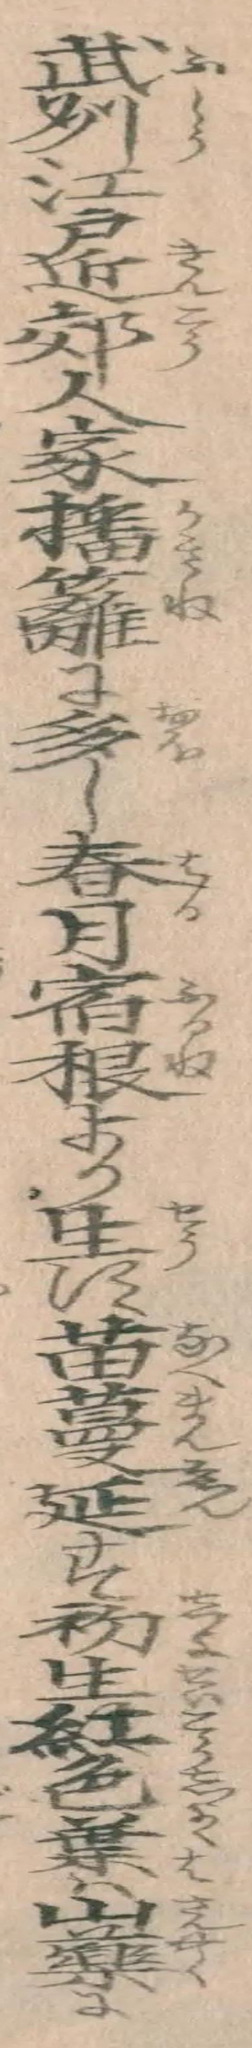武州江戸近郊人家播籬に多し春月宿根より生す苗蔓延す初生紅色葉は山薬に
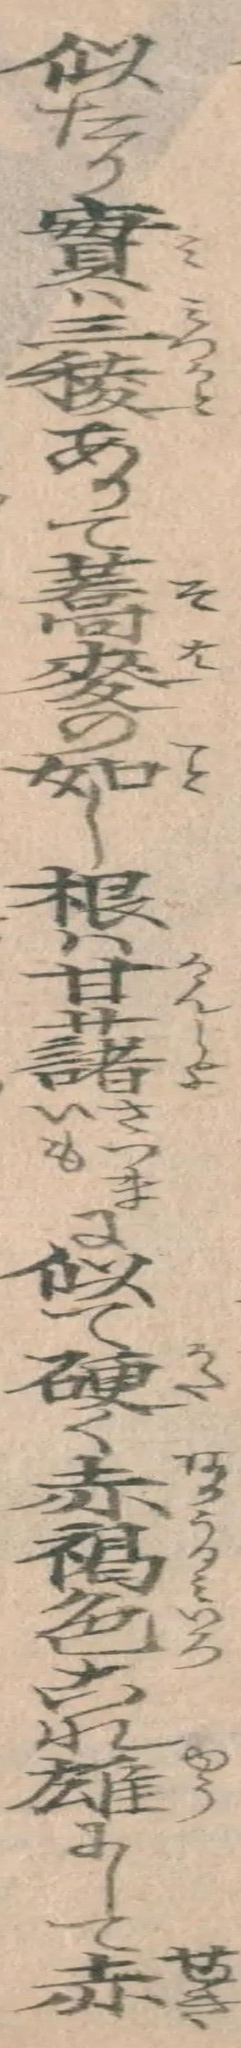似たり実は三稜ありて蕎麦の如し根は甘藷さつまいもに似て硬く赤褐色これ雄にして赤
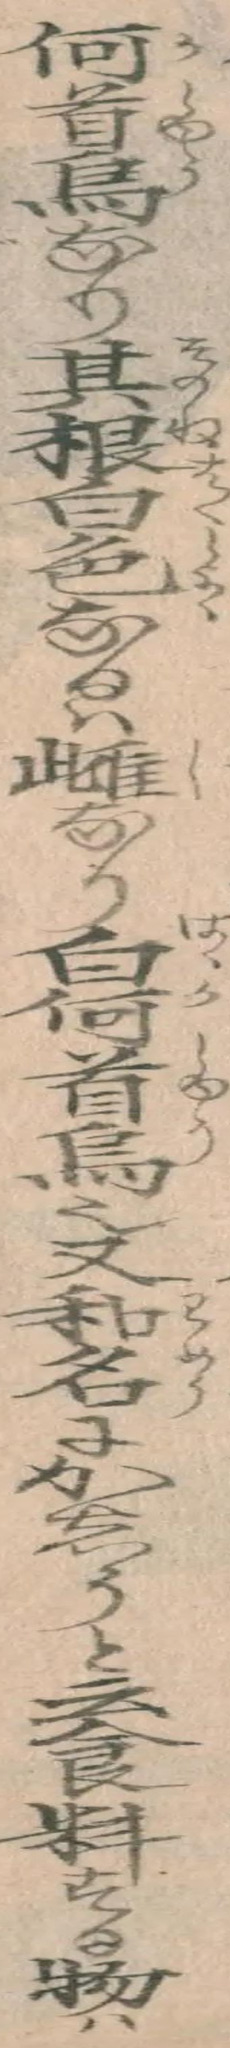何首烏なり其根白色なるは雌なり白何首烏也又和名にかしうと云食料する物は
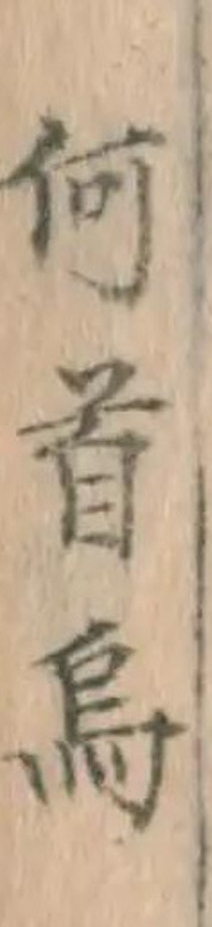何首烏

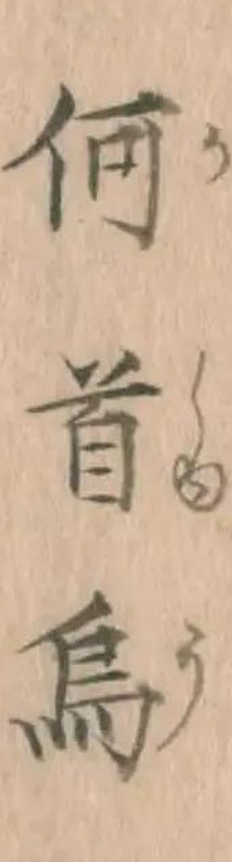何首烏
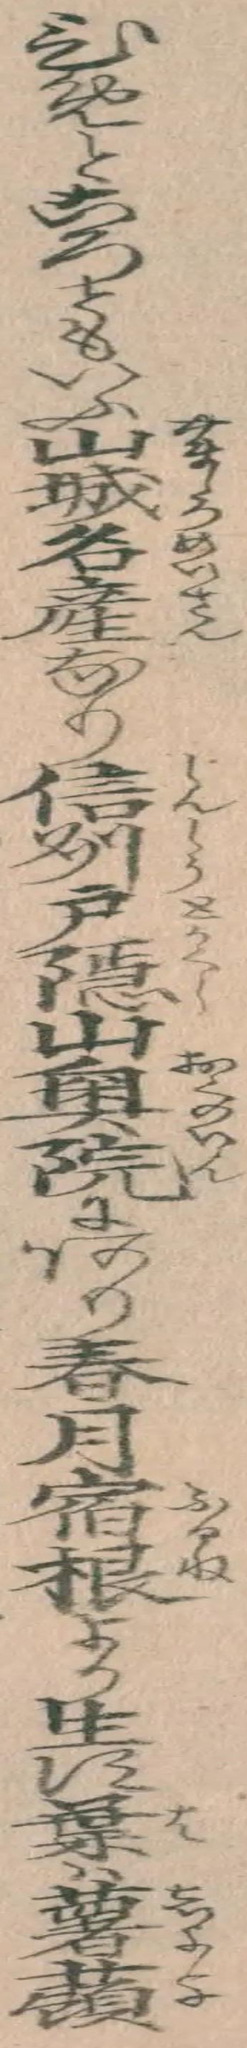ひめところともいふ山城名産なり信州戸隠山奥院にあり春月宿根より生す葉は薯蕷
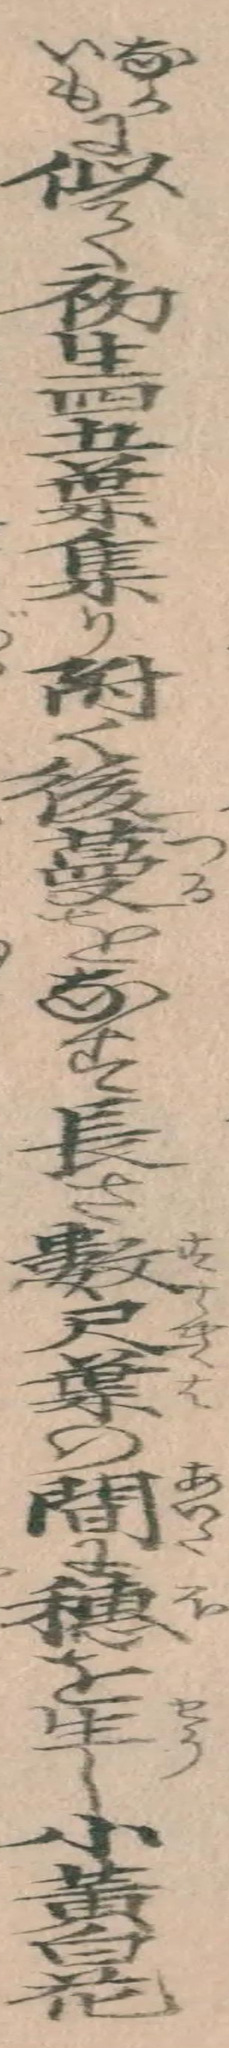なかいもに似て初生四五葉集り附く後蔓をなす長さ数尺葉の間に穂を生し小黄白花
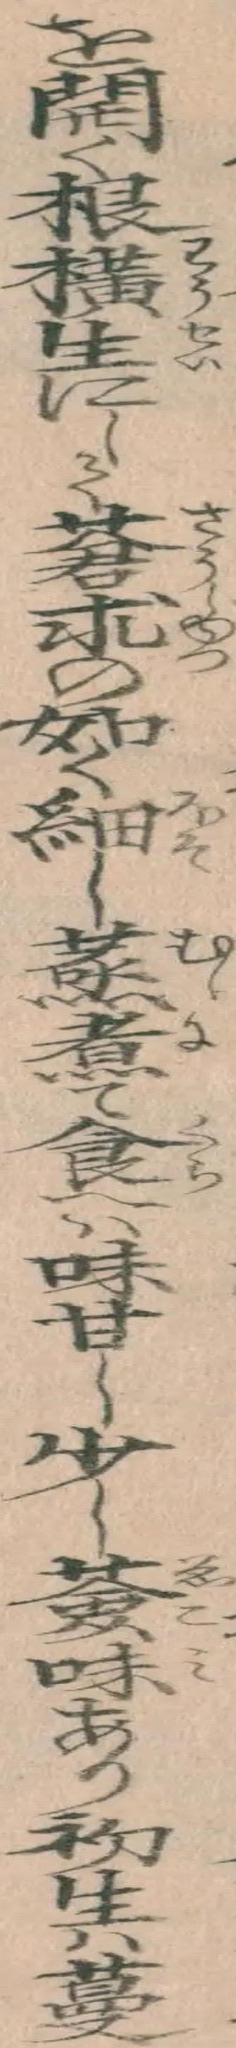を開く根横生にして蒼朮の如く細し蒸煮て食へは味甘し少し薟味あり初生は蔓
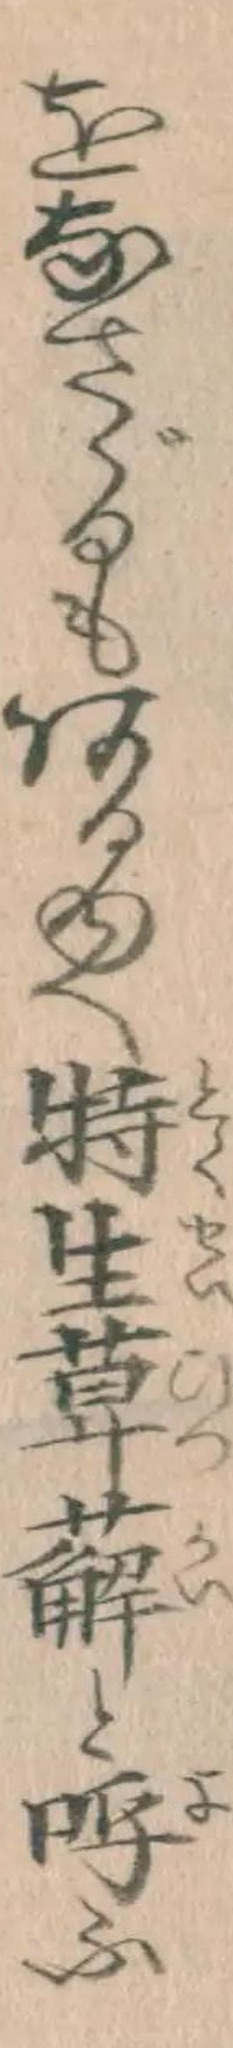をなさゞるもあるゆへ特生萆薢と呼ふ
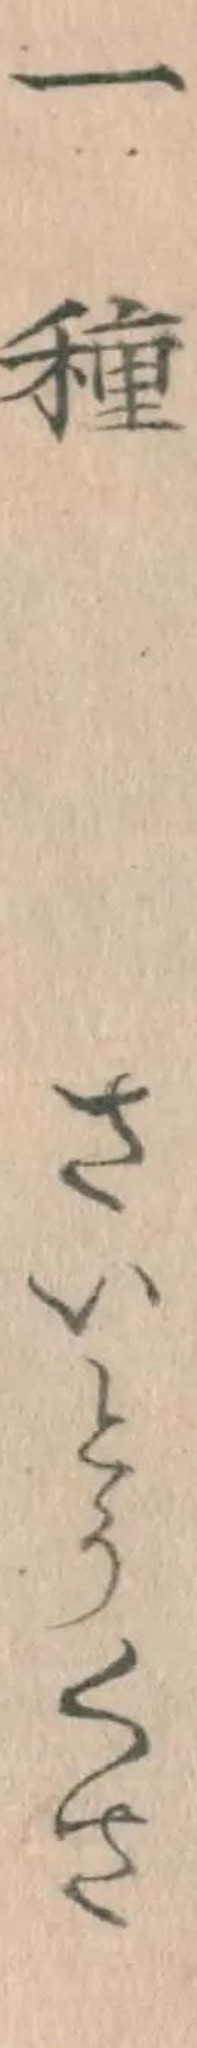一種さいとうくさ
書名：本草図譜. 巻28-30
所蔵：国立国会図書館 National Diet Library, JAPAN
